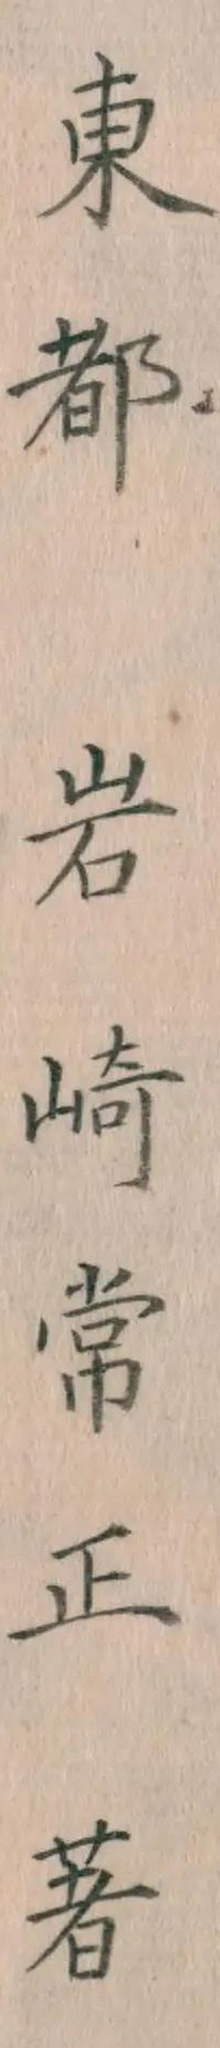東都岩崎常正著
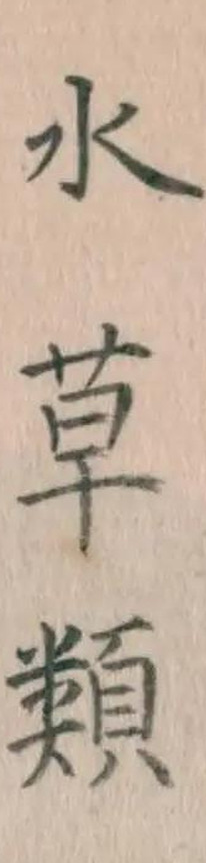水草類

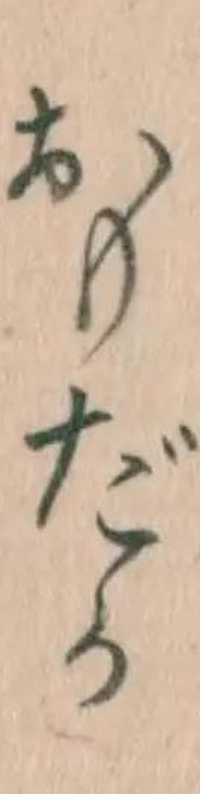おもだか

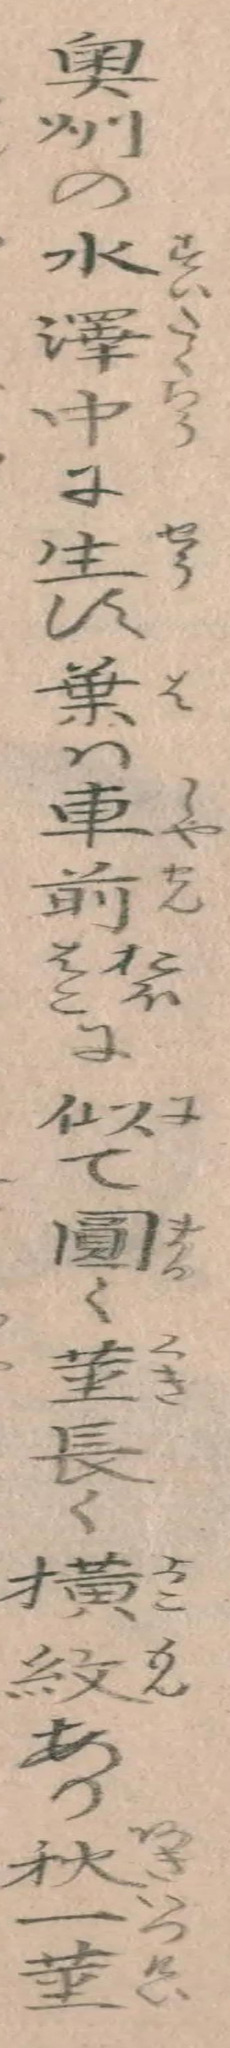奥州の水沢中に生す葉は車前おほはこに似て円く茎長く横紋あり秋一茎
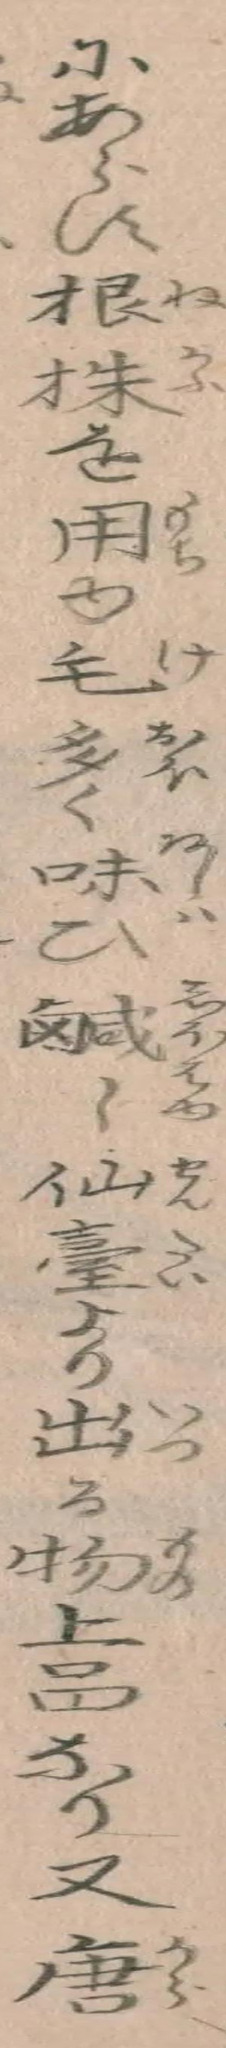にあらす根株を用ゆ毛多く味ひ鹹し仙台より出る物上品なり又唐
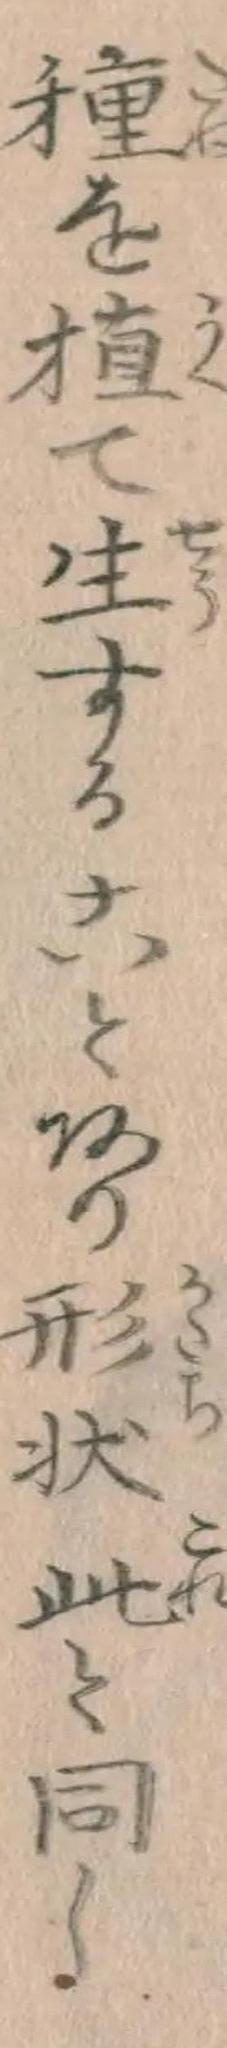種を植て生することあり形状此と同し
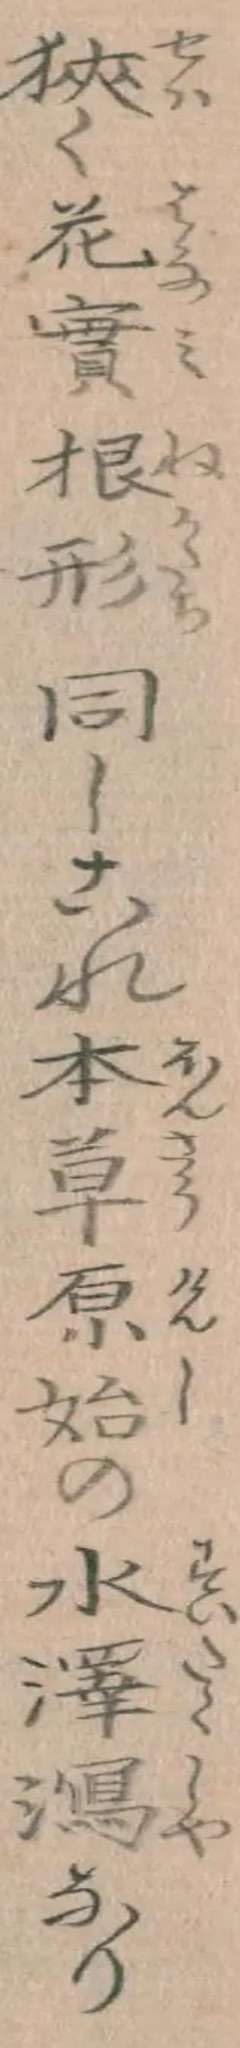狭く花実根形同しこれ本草原始の水沢瀉なり
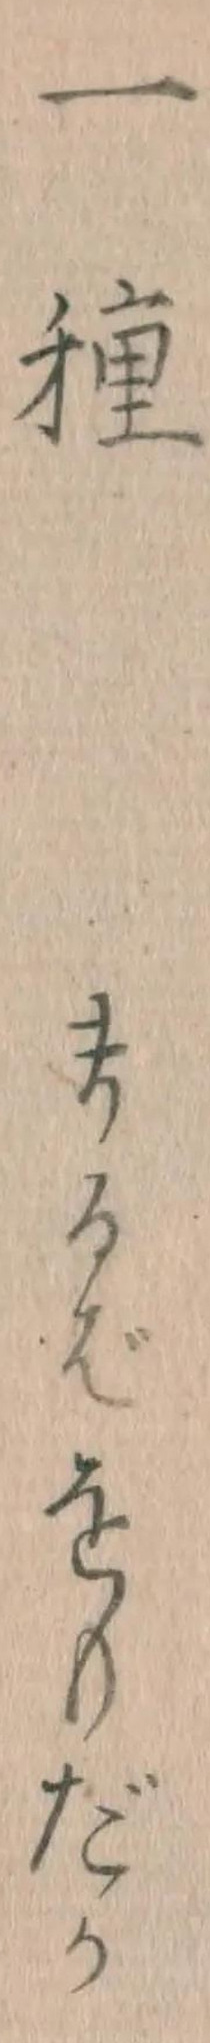一種まるばをもだか
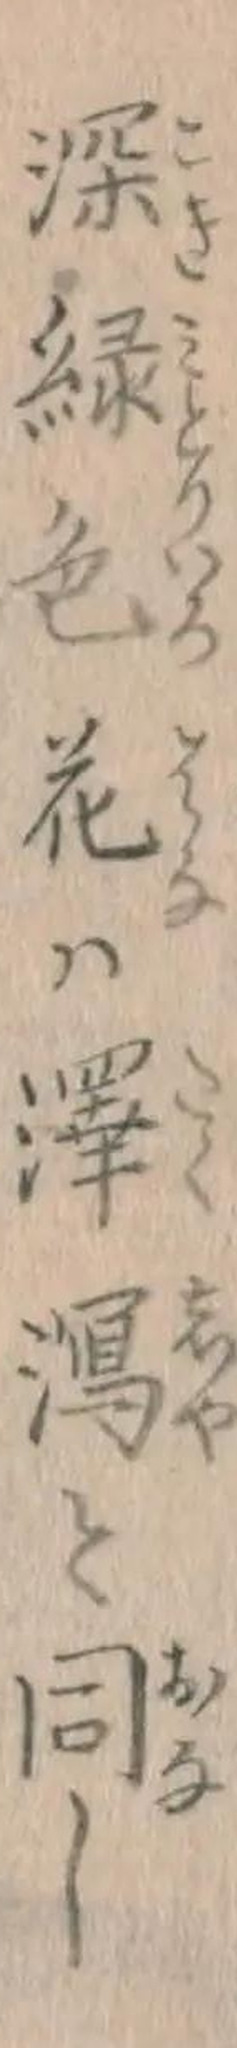深緑色花は沢瀉と同し
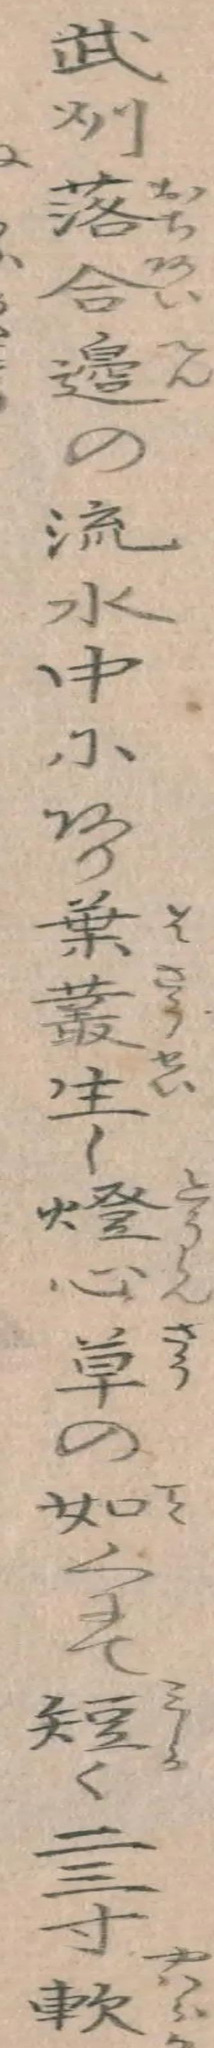武州落合辺の流水中にあり葉叢生し灯心草の如くにて短く二三寸軟
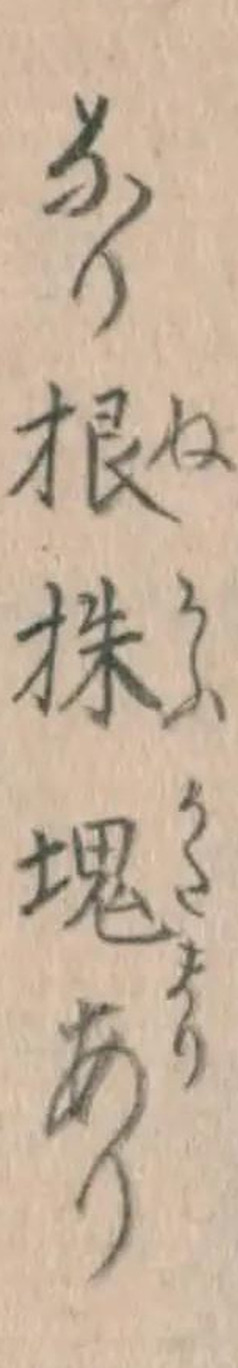なり根株塊あり
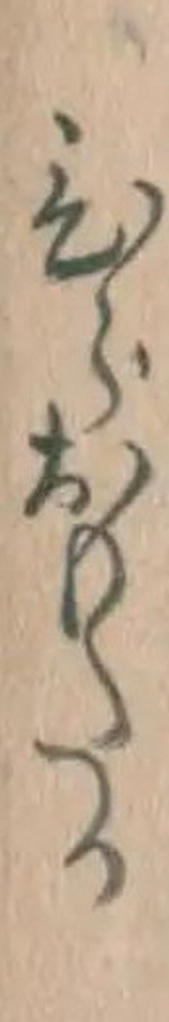ひらおもたか

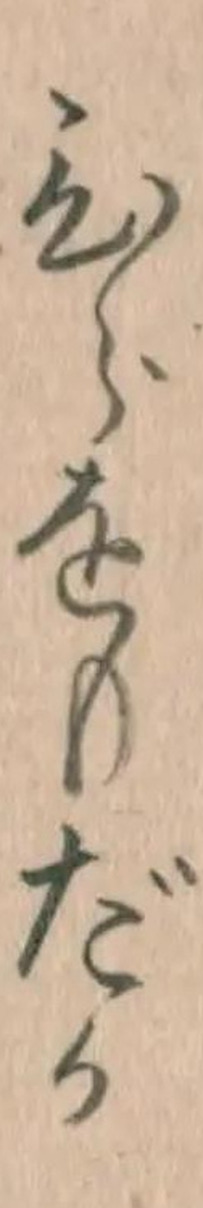ひらをもだか
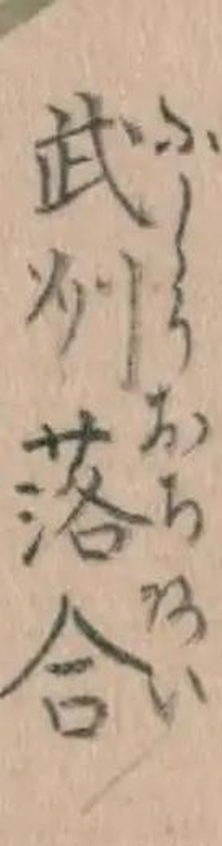武州落合
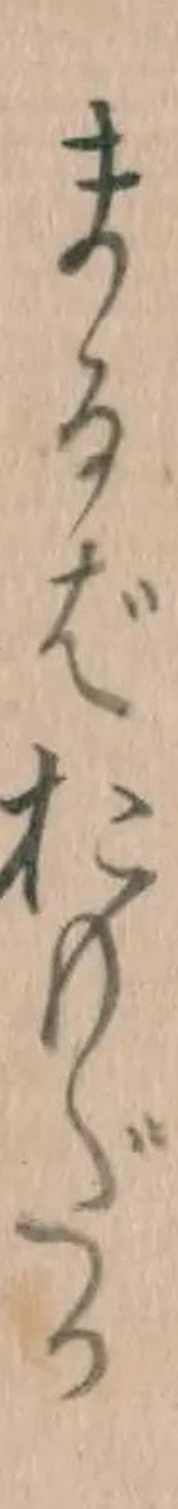まるばおもだか
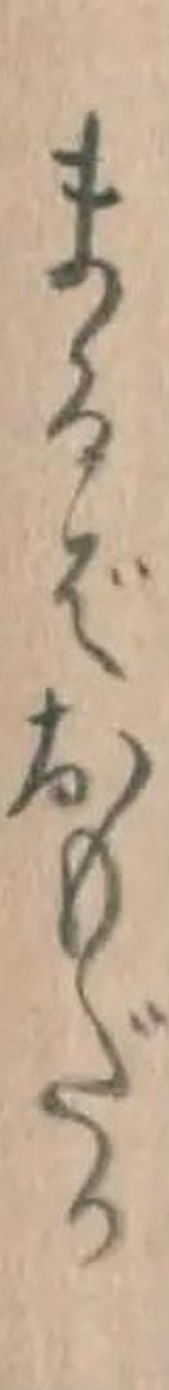まるばおもだか
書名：本草図譜. 巻31-33
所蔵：国立国会図書館 National Diet Library, JAPAN
